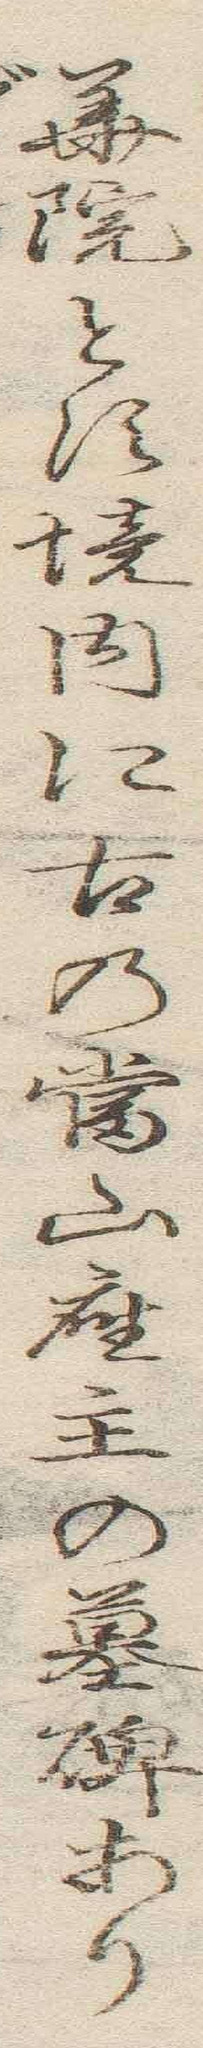華院とす境内に古の當山座主の墓碑あり
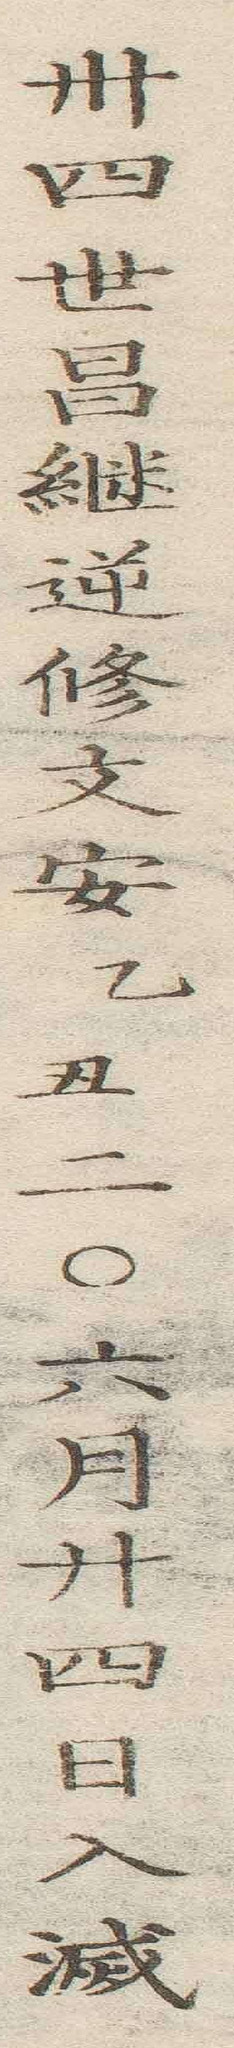卅四世昌継逆修文安乙丑二○六月廿四日入滅
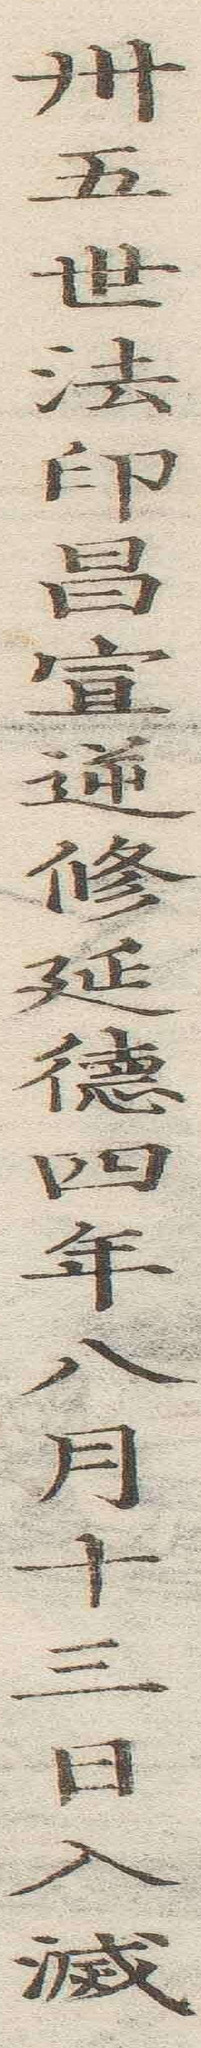卅五世法印昌宣逆修延德四年八月十三日入滅
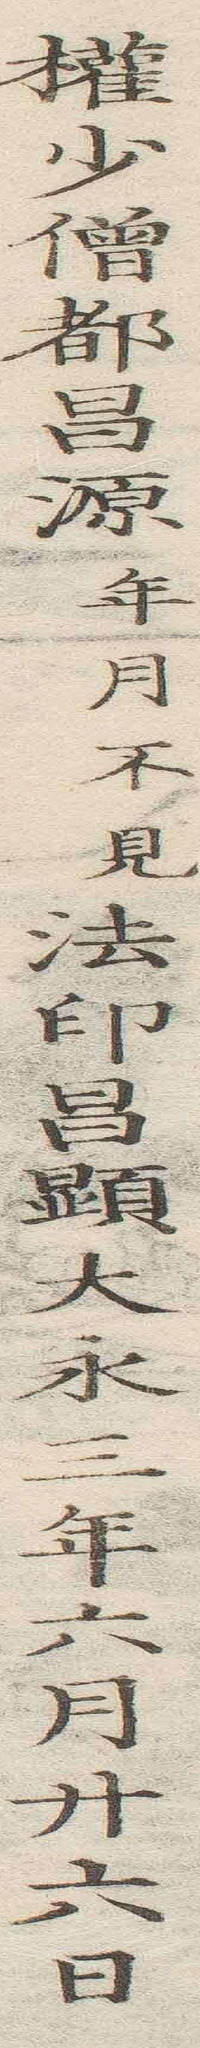權少僧都昌源年月不見法印昌顕大永三年六月廿六日
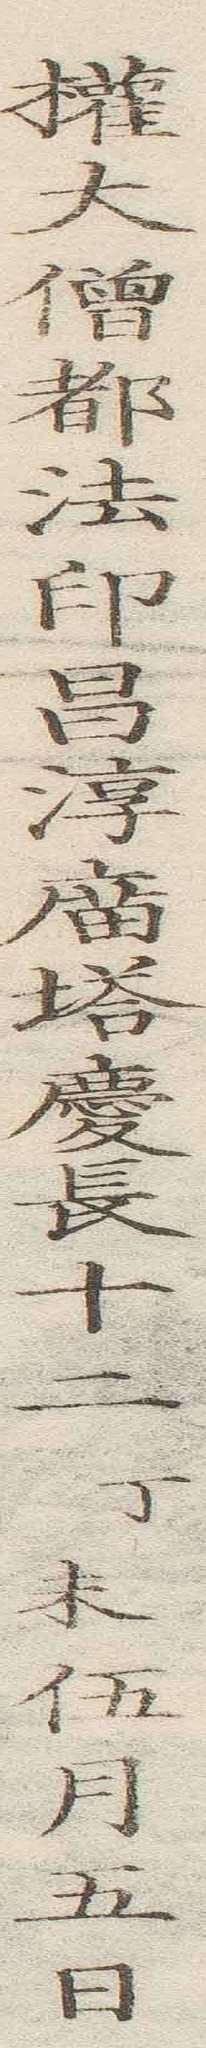權大僧都法印昌淳庿塔慶長十二丁未伍月五日
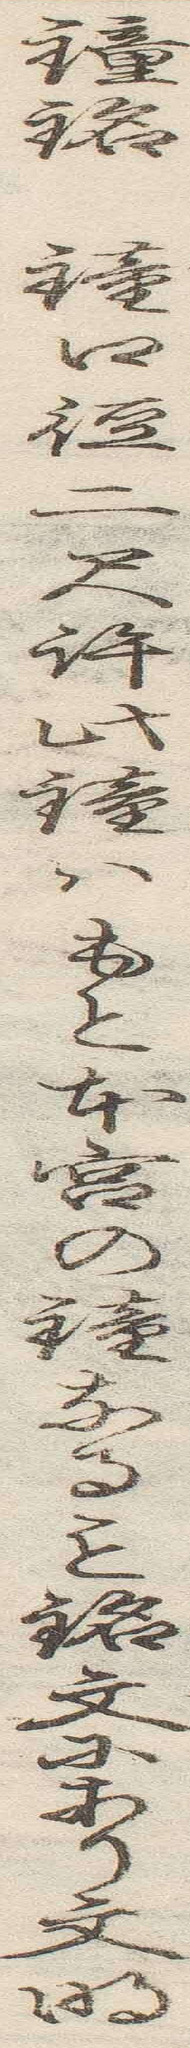鐘銘鐘口徑二尺許此鐘はもと本宮の鐘なること銘文にあり文明
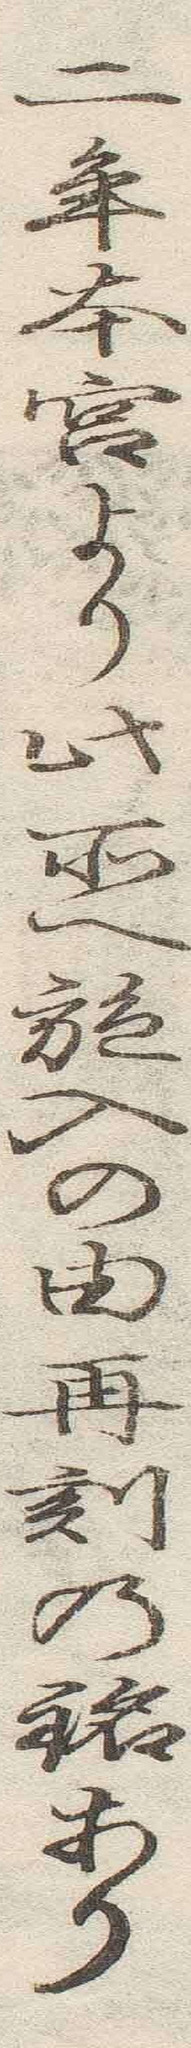二年本宮より此所へ施入の由再刻の銘あり
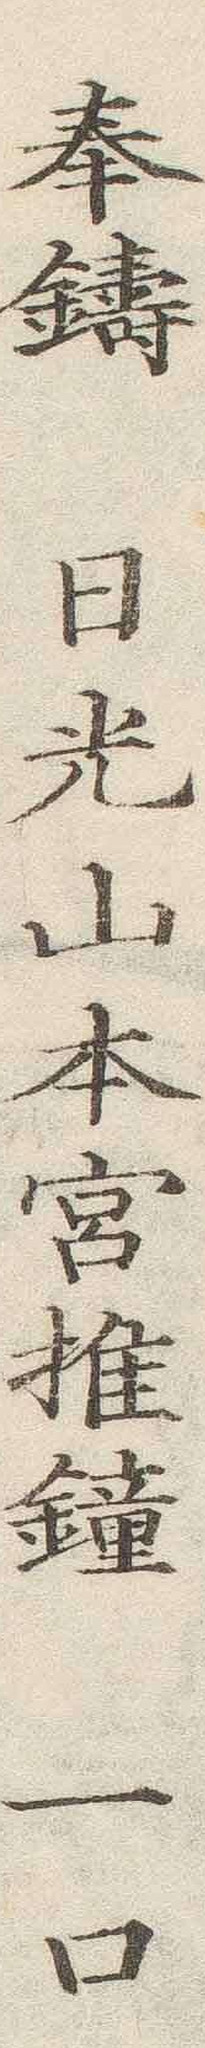奉鑄日光山本宮推鐘一口
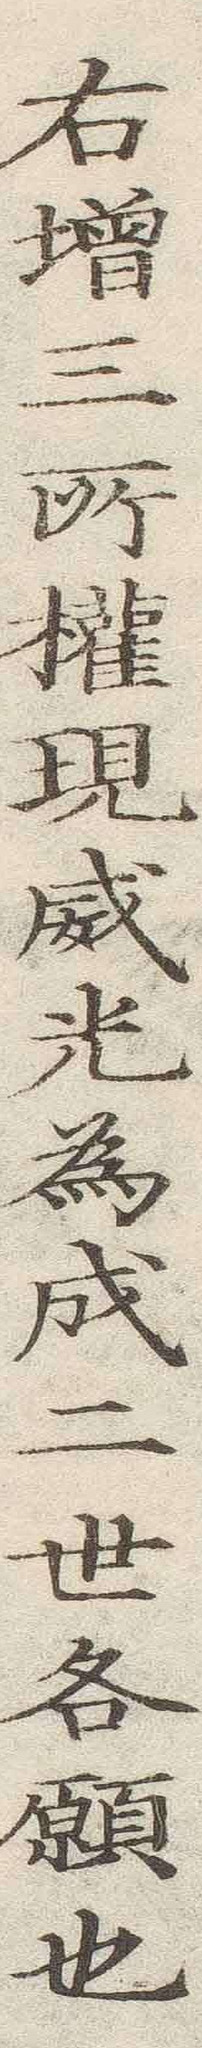右增三所權現威光為成二世各願也
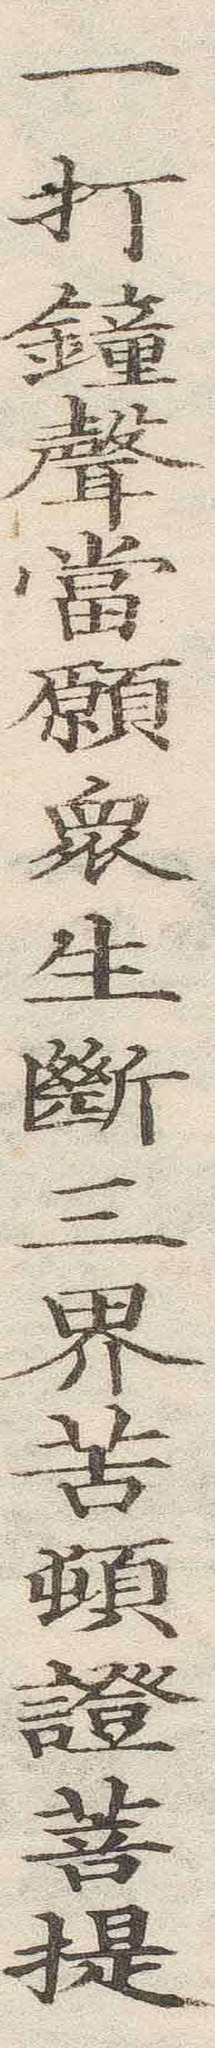一打鐘聲當願衆生斷三界苦頓證菩提
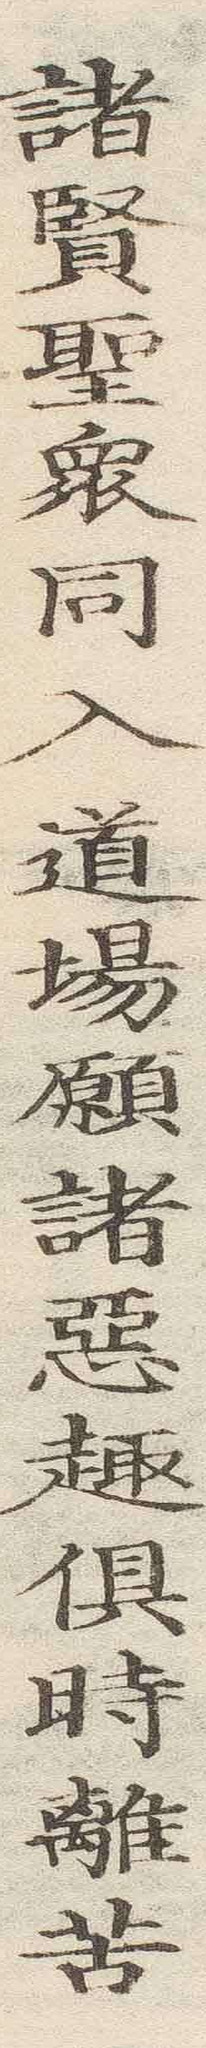諸賢聖衆同入道場願諸惡趣俱時離苦
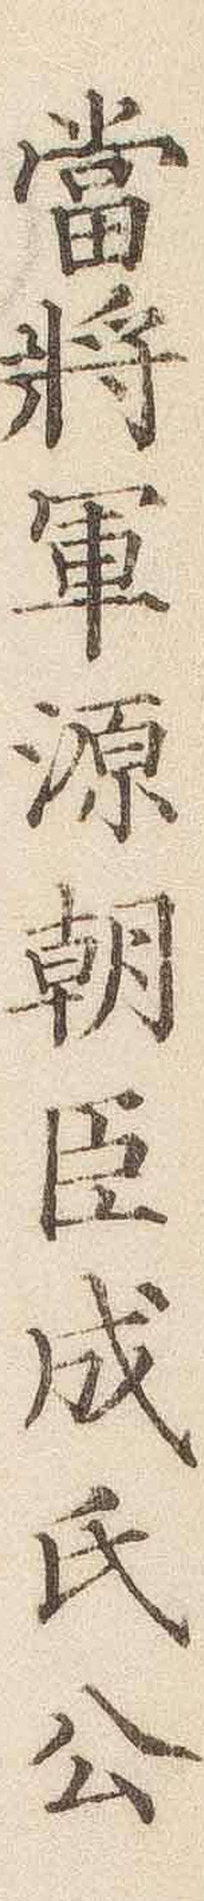當將軍源朝臣成氏公
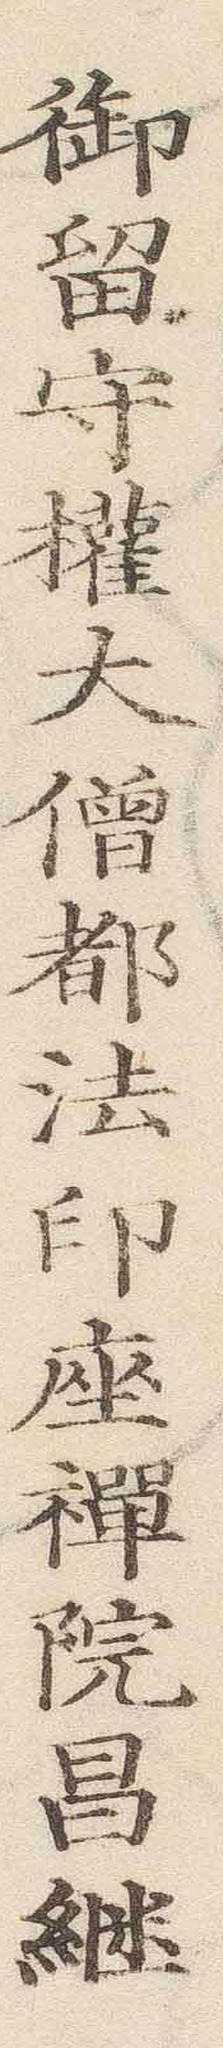御留守權大僧都法印座禪院昌継
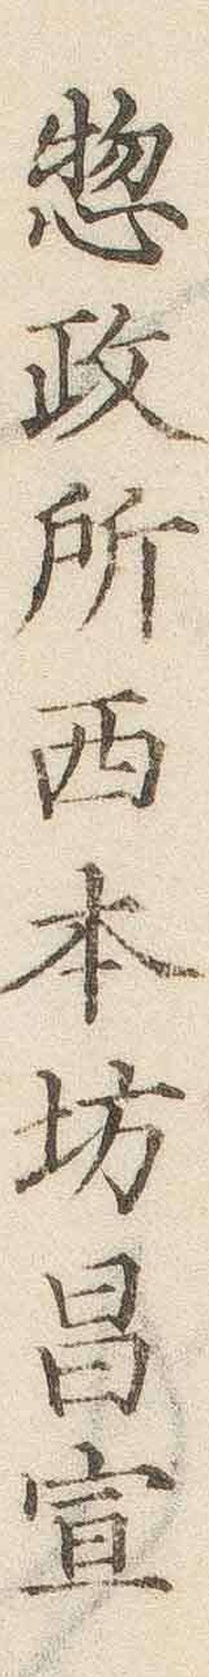惣政所西本坊昌宣
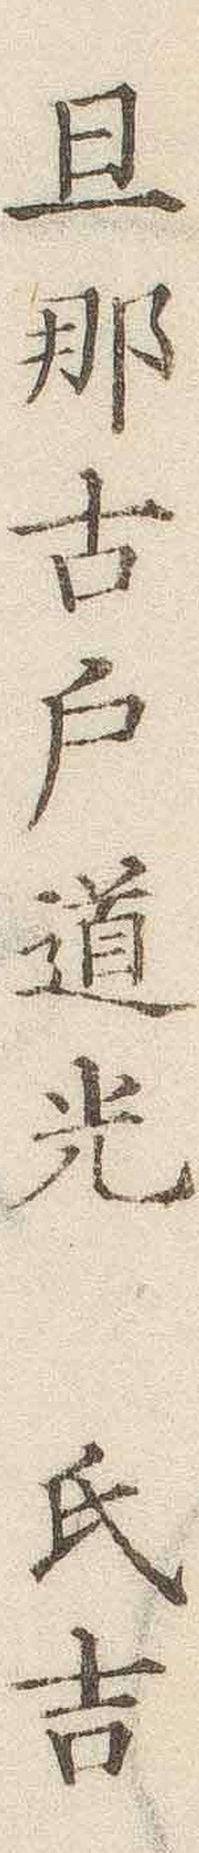旦那古戸道光氏吉
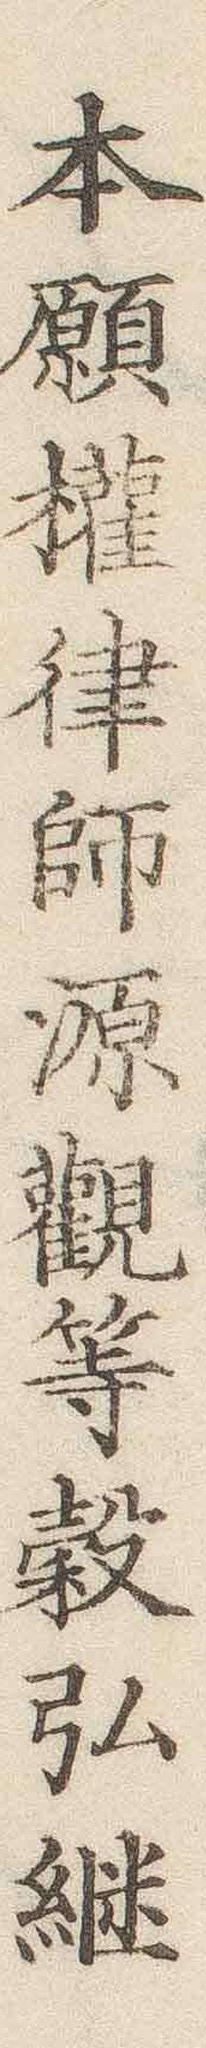本願權律師源觀等穀弘継
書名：日光山志
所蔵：東京学芸大学附属図書館 国文学研究資料館
